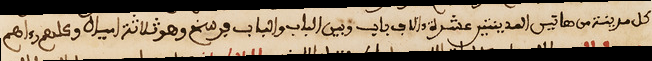كل مدينة من هاتين المدينتين عشرة الاف باب وبين الباب والباب فرسخ وهو ثلاثة اميال وكلهم رءاهم
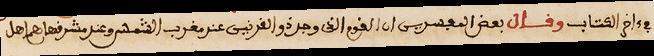في ءاخر الكتاب وقال بعض المفسرين ان القوم الذي وجد ذو القرنين عند مغرب الشمس عند مشرقها هم اهل
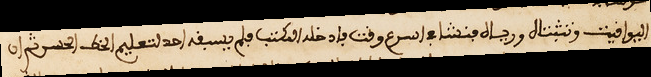اليواقيت وتثبتاه ورياه فنشا في اسرع وقت فادخله المكتب فلم يسبقه احد لتعليم الخط الحسن ثم ان
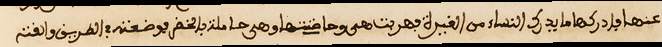عنها فادركها ما يدرك النساء من الغيرة فهربت هى وحاضنتها وهى حاملة بالخضر فوضعته في الطريق والقته
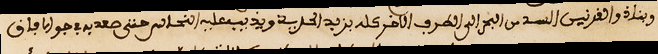وبنا ذو والقرنين السد من البحر الى الطرف الاخر كله بزبد الحديد ويذيب عليه النحاس حتى صعد به في جو الافاق
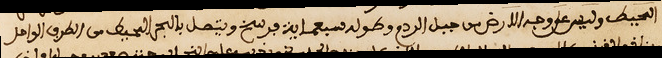المحيط وليس على وجه الارض من جبل الردم وطوله سبعماية فرسخ ويتصل بالبحر المحيط من الطرف الواحد
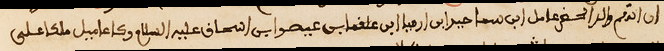ان ا#م والد الخضر عامل ابن سماحير ابن ارميا ابن علقما بن عيصوا بن اسحاق عليه السلام وكا عاميل ملكا على
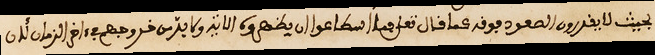بحيث لا يقدرون الصعود فوقه كما قال تعلى فما اسطاعوا ان يظهروه الاية ولا بدّ من خروجهم في ءاخر الزمان لأن
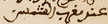عند مغرب الشمس
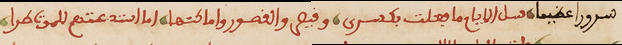سرورا عظيما سل الايام ما فعلت بكسرى وقيصر والقصور واما كتها اما استد عتهم للموت طرا
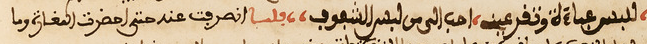للبس عباءة وتقر عينى احب الى من لبس للشفوف فلما انصرفت عنه حتى احضرت المغارة وما
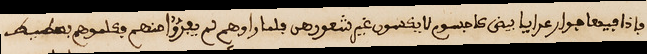فاذا فيها جوار عرايا بيض كاجسوم لا يكسون غير شعورهن فلما رادهم لم يفروا منهم فكلموهم بهطيط
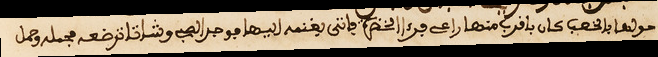حولها بالخصب كان بالقرب منها راعى فرءا الخضرة فاتى بغنمه اليها فوجد الصبى وشاتا ترضعه مجمله وحمل
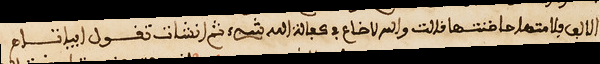الالف فلامتها حاضنتها قالت والله لاضاع في كفالة الله شىء ثم انشات تقول ابياتام
